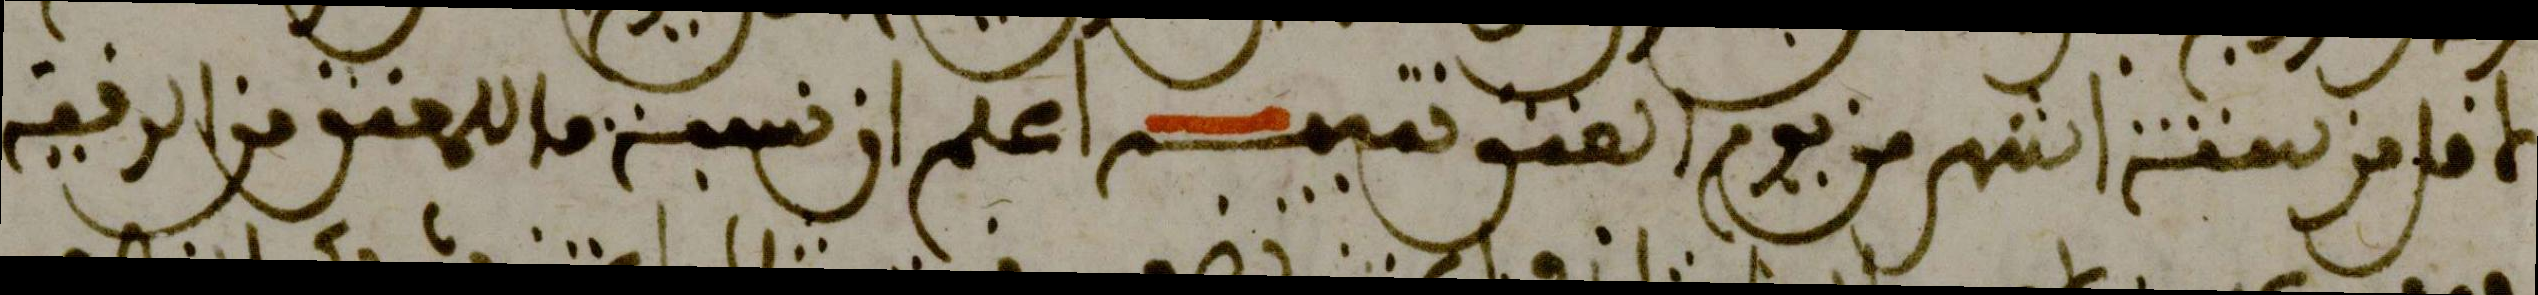لا قل من ستة اشهر من يوم العتق تنبيه اعلم ان نسبة ما للمعتق من الرقية
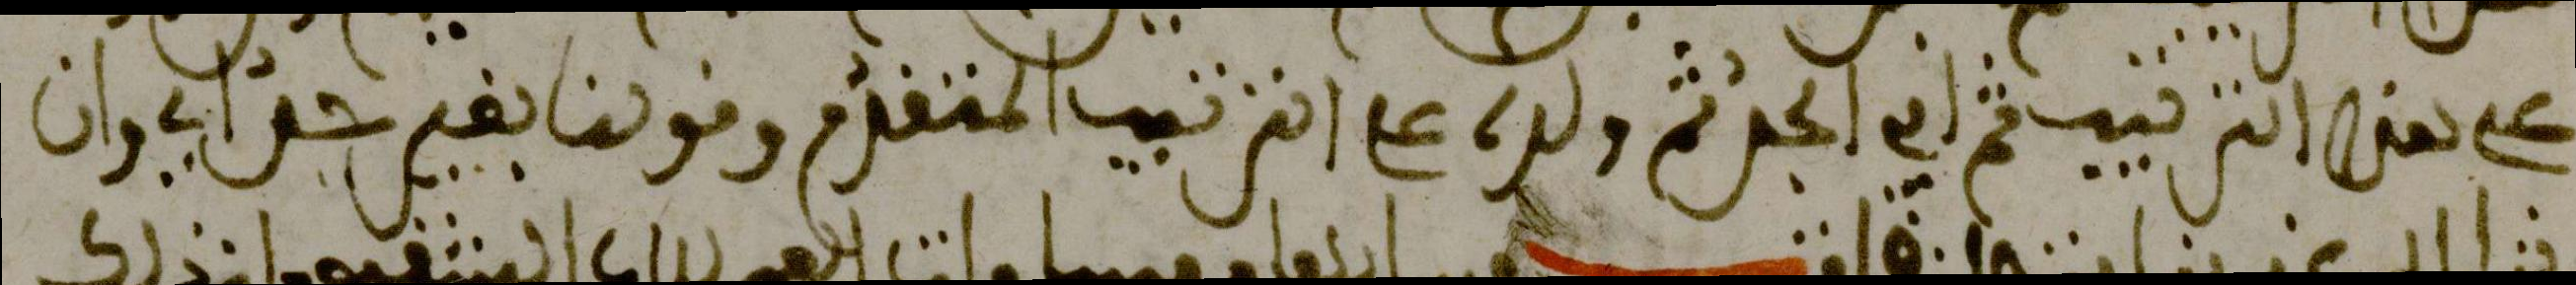على هذا الترتيب ثم ابي الجد ثم ولده على الترتيب المتقدم وقولنا بغير جد اي وان
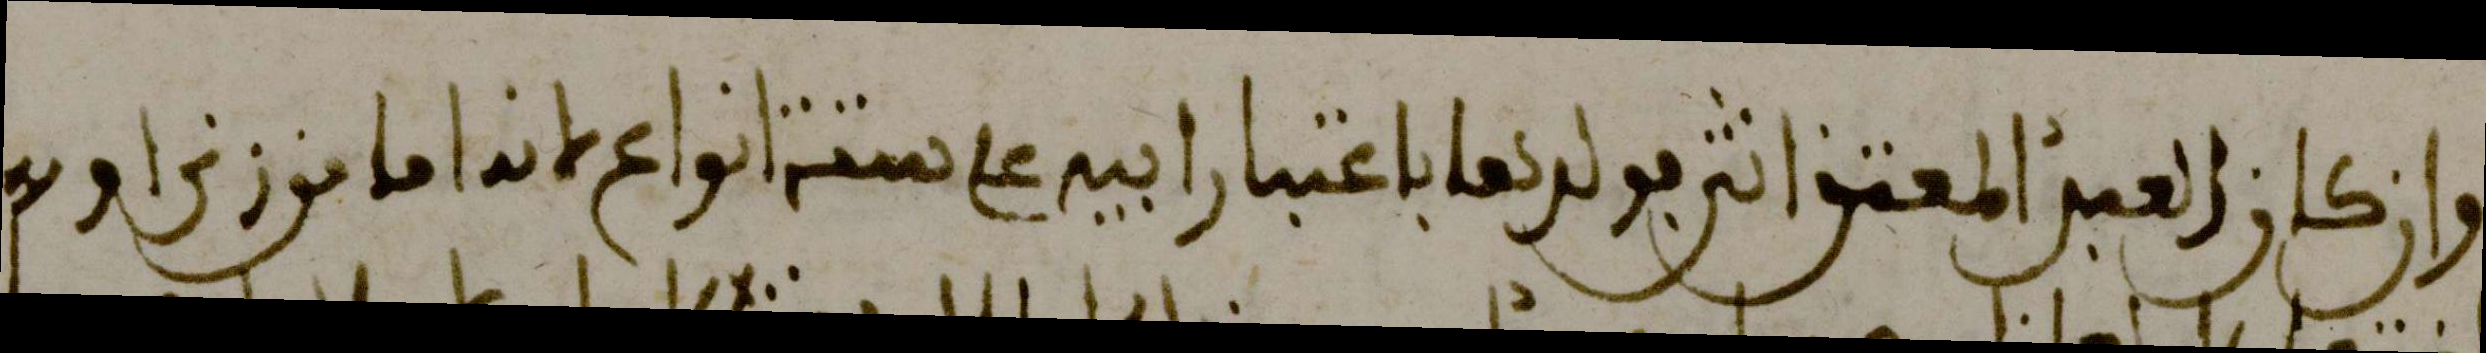وان كان العبد المعتق انثى فولدها باعتبار ابيه على ستة انواع لانه اما من زنى او
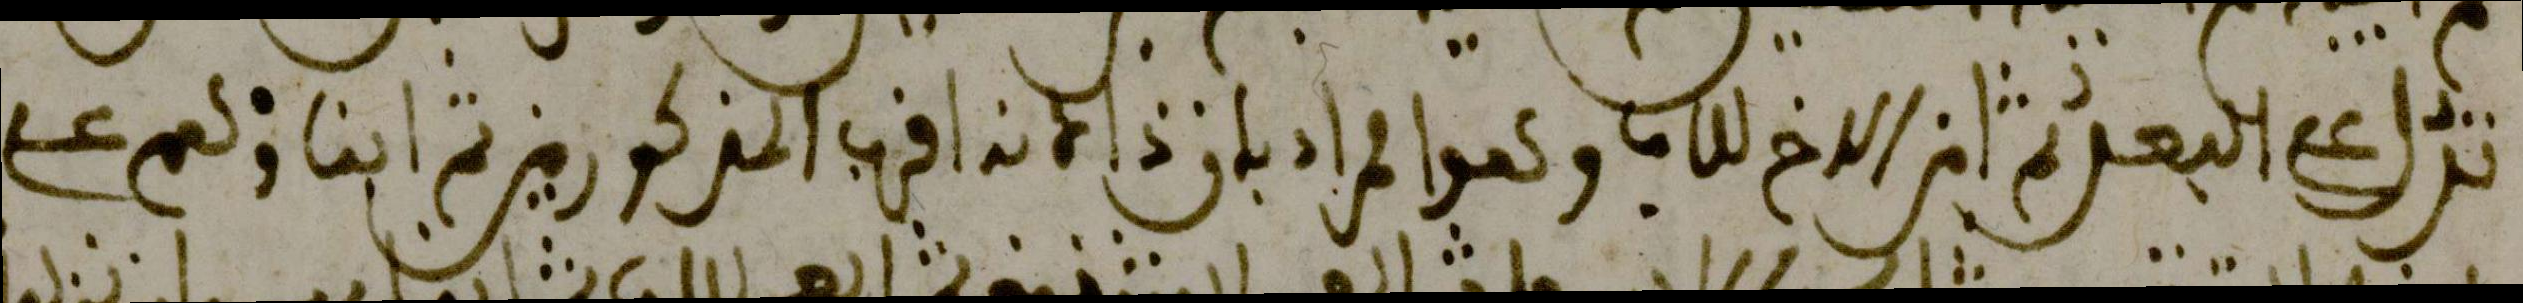تدل على البعد ثم ابن الاخ للاب وهو المراد بان ذا لانه اقرب المذكورين ثم ابناؤهم على
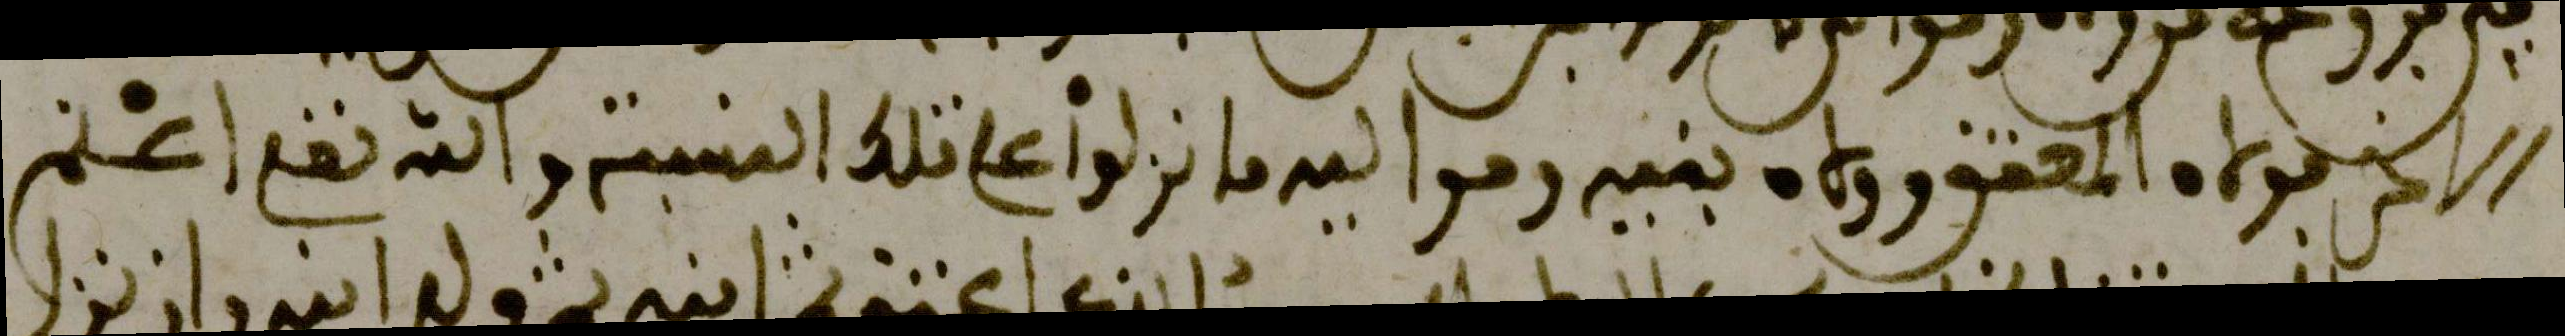الاخر فولاء المعتق وولاء بنيه ومواليه ما بزلوا على تلك النسبة والله تعلى اعلم
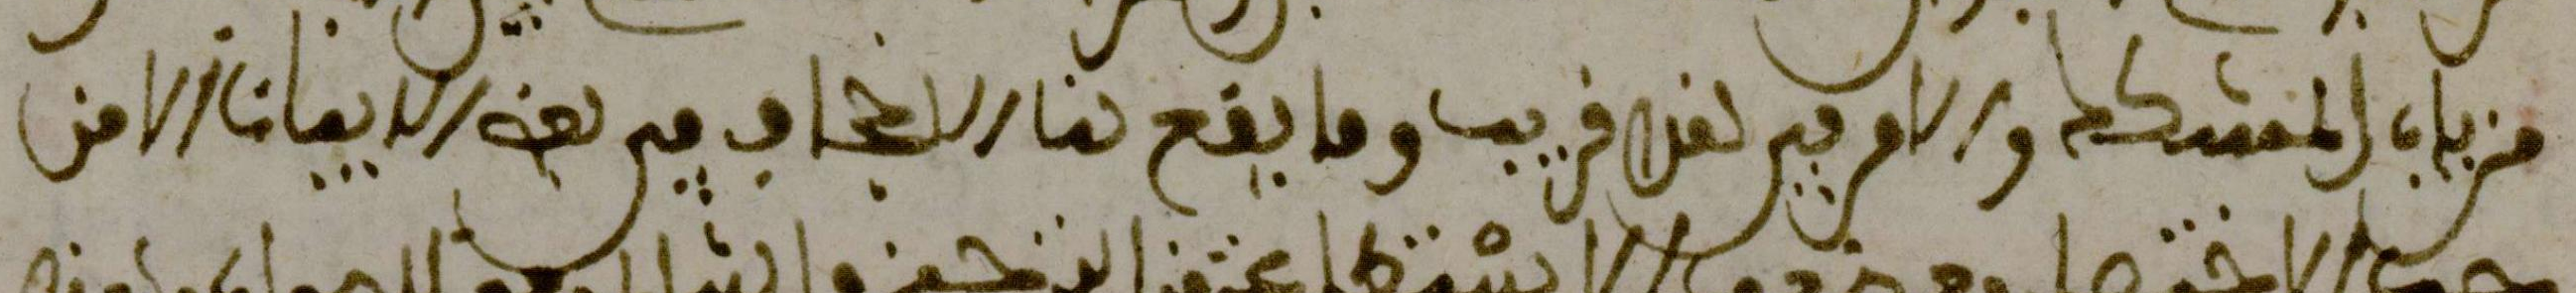من باب المشكك والامر في هذا قريب وما يقع لنا لاحجاف في بعض الابيات الا من
